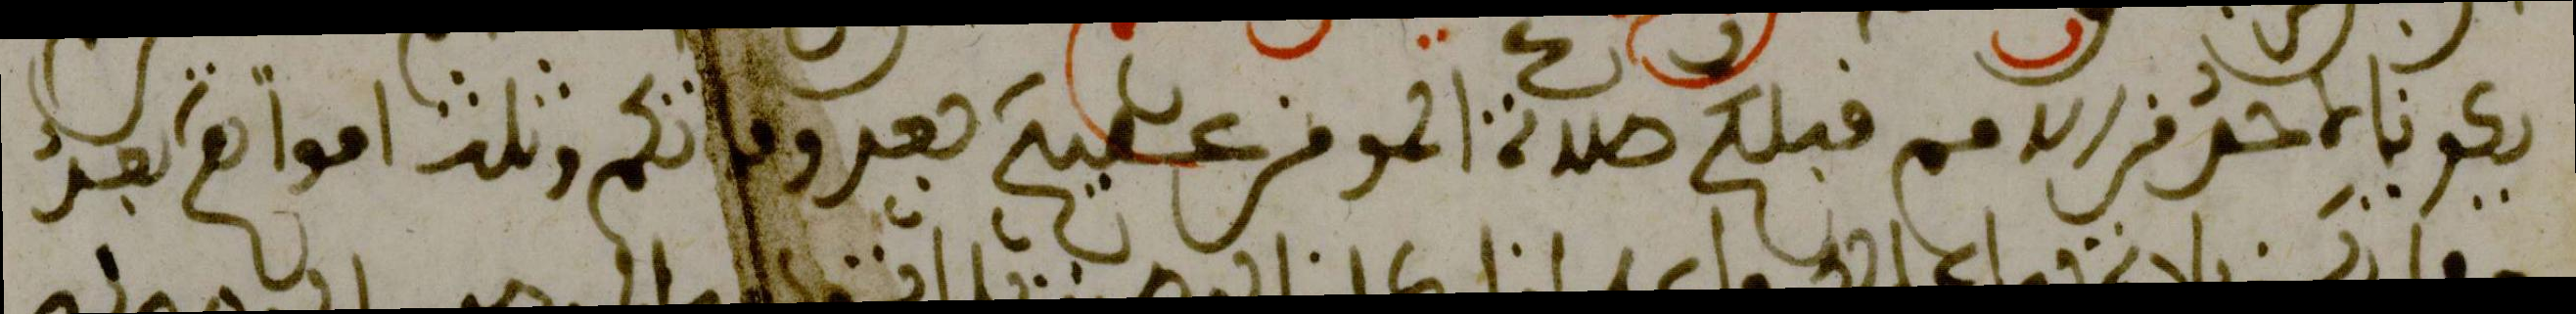يكونا لاحد من الامم قبلكم صلاة المومن عليكم بعد وفاتكم وثلث اموالكم بعد
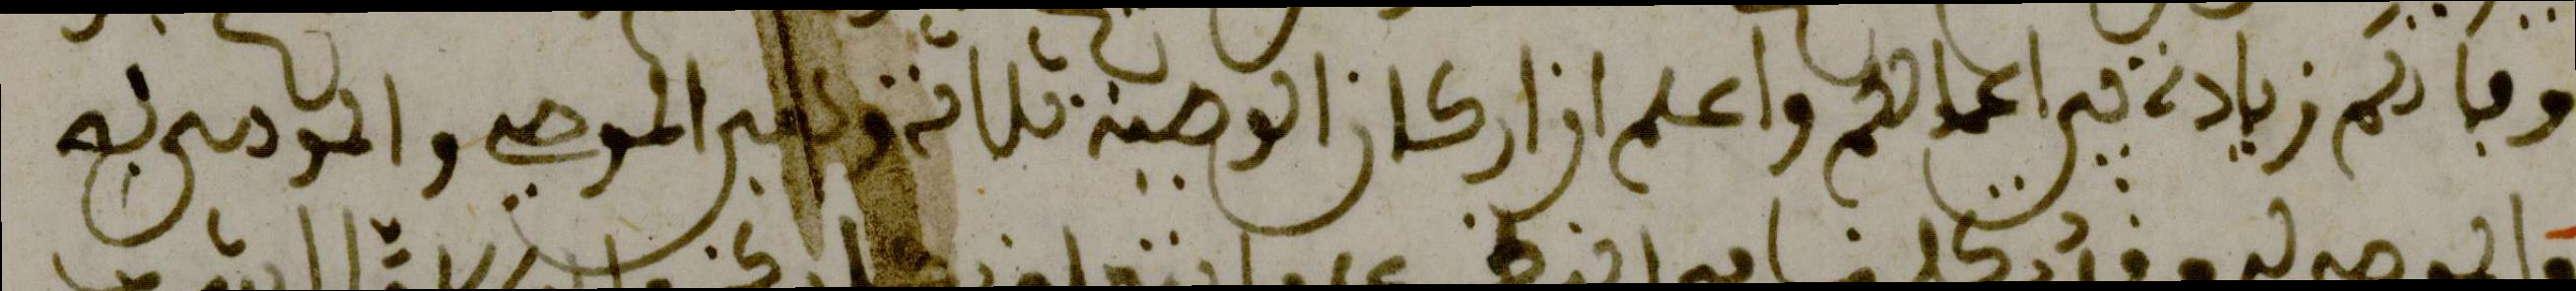وفاتكم زيادة في اعمالكم واعلم ان اركان الوصية ثلاثة وهي الموصي والموصى به
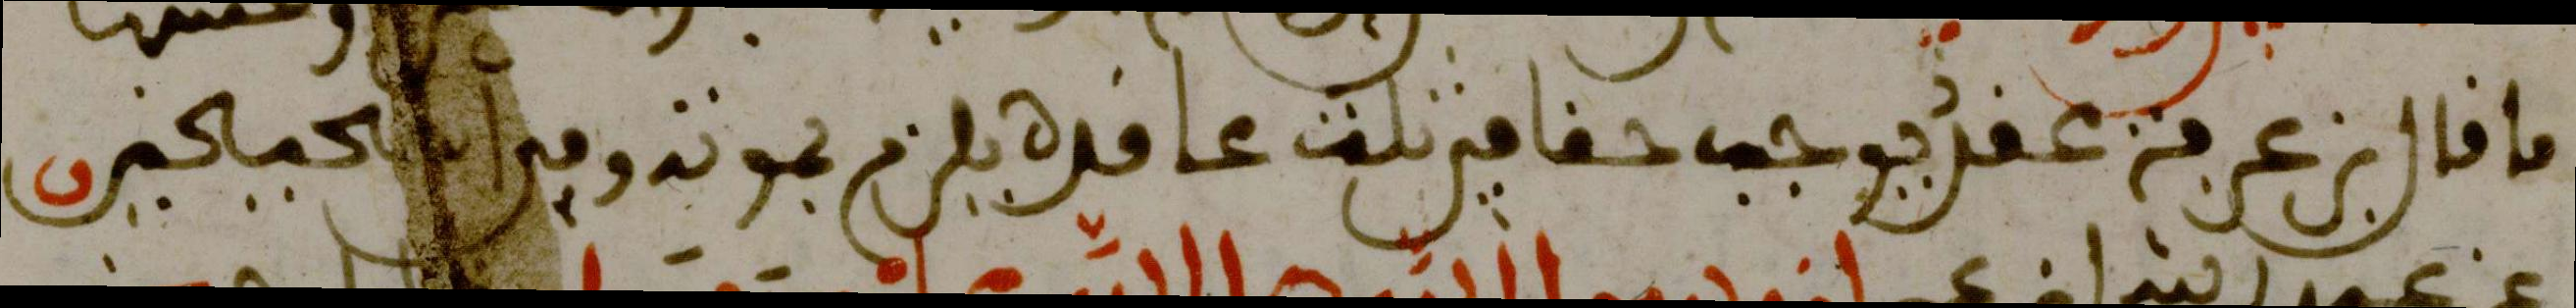ما قال بن عرفة عقد يوجبه حقا في ثلث عاقده يلزم بموته وفي الصحيحين
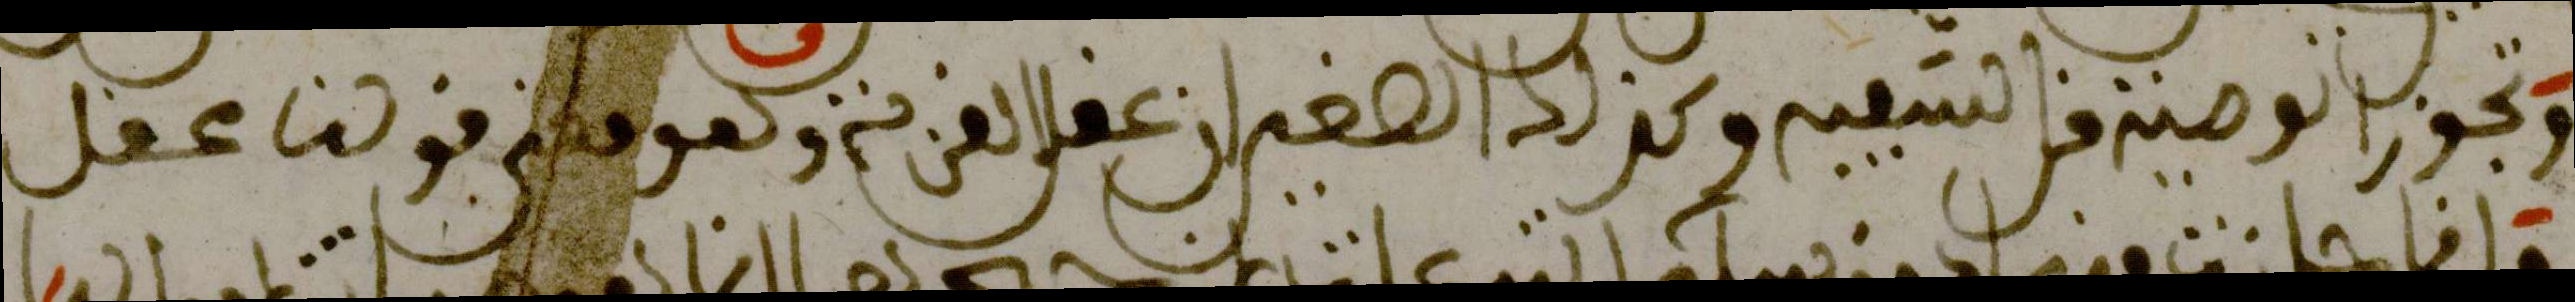وَتجوز الوصية من السفيه وكذلك الصغير ان عقل القربة وهو معنى قولنا عقل
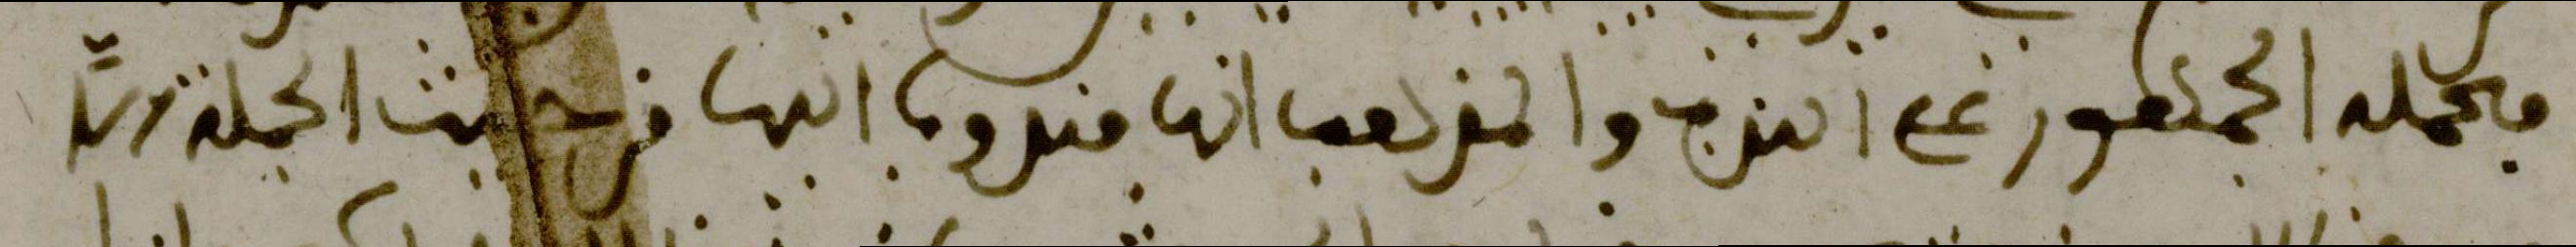فحمله الجمهور على الندب والمذهب انها مندوب اليها من حيث الجملة الّا
